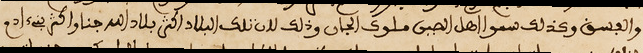الفسق كذلك سموا اهل الشين ملوك الجان وذلك لان تلك البلاد اكثر بلاد الله جناوا اكثر بنى ءادم
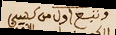وتبع اول من كسى
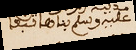عليه وسلم بناها تبعا
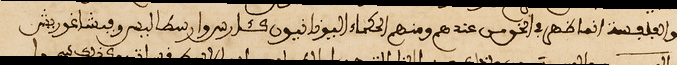والفلسفة انما ظهر في الخق من عندهم ومنهم الحكماء اليونانيون كئارس وارسطاليس وفيشاغوريش
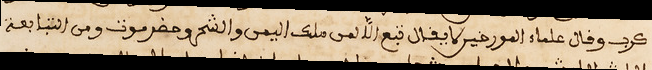كرب وقال علماء المورخين لا يقال تبع الا لمن ملك اليمن والشحر وحضر موت ومن التبابعة
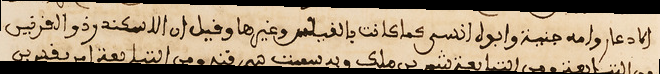الادعار وامه جنية وابوه انسى كما كانت بالقيلس وغيرها وقيل ان الاسكندر ذو القرنين
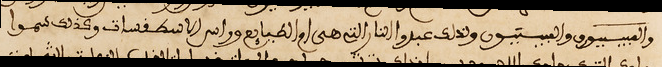والبيببوق والبيتيون ولذلك عبدوا النار التي هي ام الطبائع و راس الاسطقسات وكذلك سموا
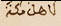لاهل مكة
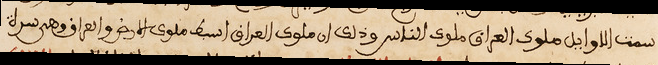سمت الاوايل ملوك العراق ملوك الناس وذلك ان ملوك العراق اسبط ملوك الارض والعراق وهى سرة
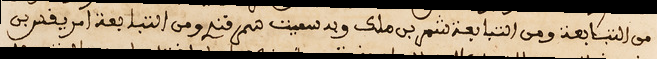من التبابعة ومن التبابعة شمر بن ملك وبه سميت سمر قند ومن التبابعة امريقس بن
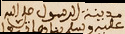مدينة الرسول صل الله
